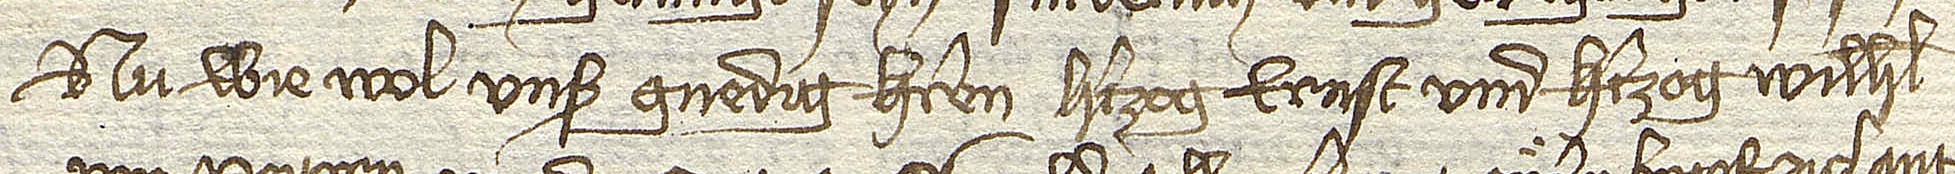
Nu wie wol vnſ* gnedig h*ren h*cʒog Ernſt vnd h*cʒog wilhl*
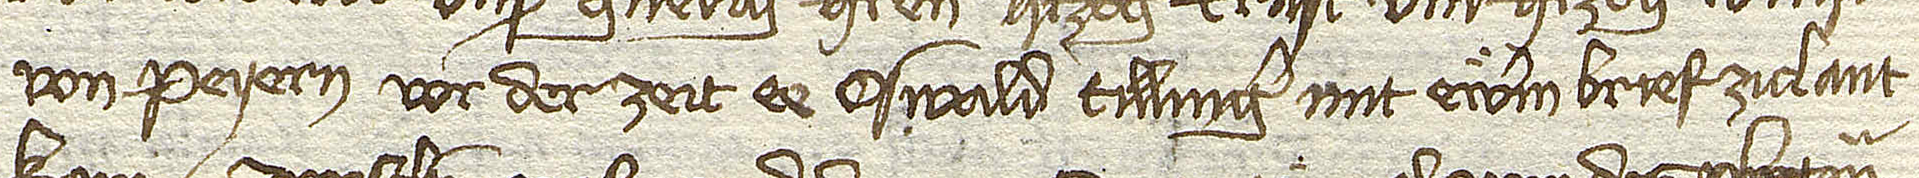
von Peyern vor der ʒeit ee Oſwald tilling* mit ew*m brief ʒulant
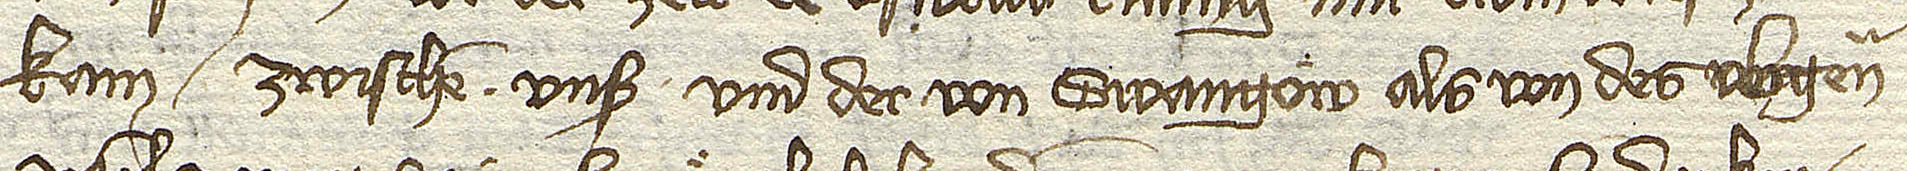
kam ʒwiſche* . vnſ* . vnd der von Swangöw als von des vorgen*
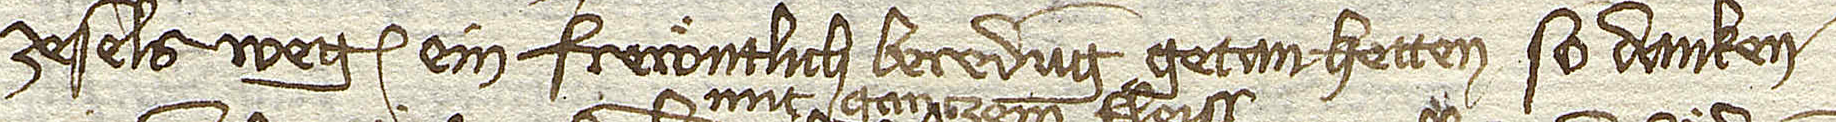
ʒeſels weg* ein frewntlich beredu*g getan hetten ſo danken
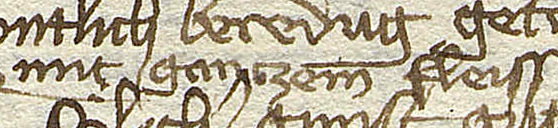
mit gancʒem fleiſſ
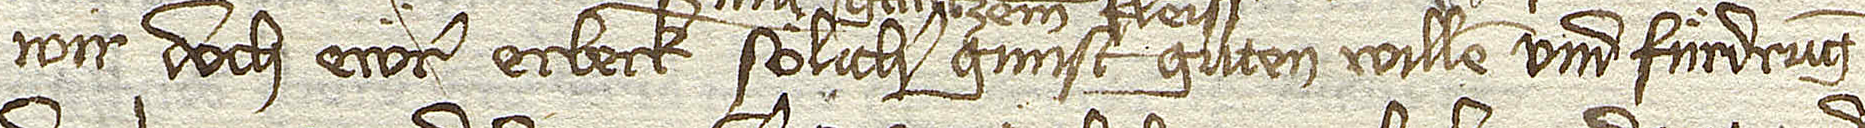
wir doch ew*r erberk* ſölich* gunſt guten wille* vnd fürdru*g
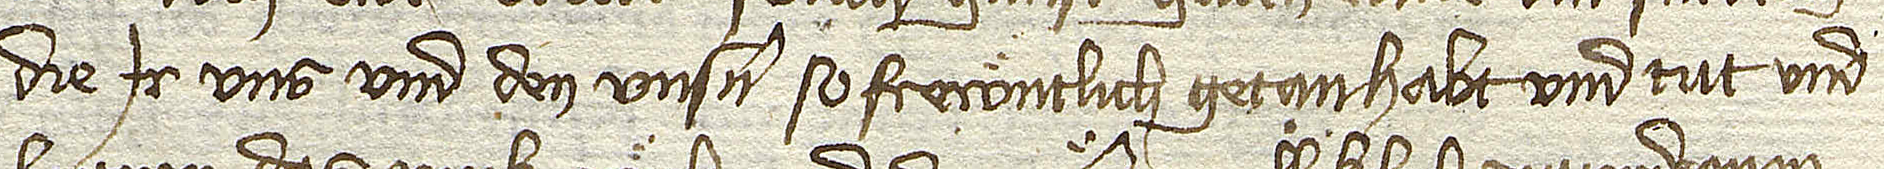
die Ir vns vnd den vnſ*n ſo frewntlich getan habt vnd tut vnd
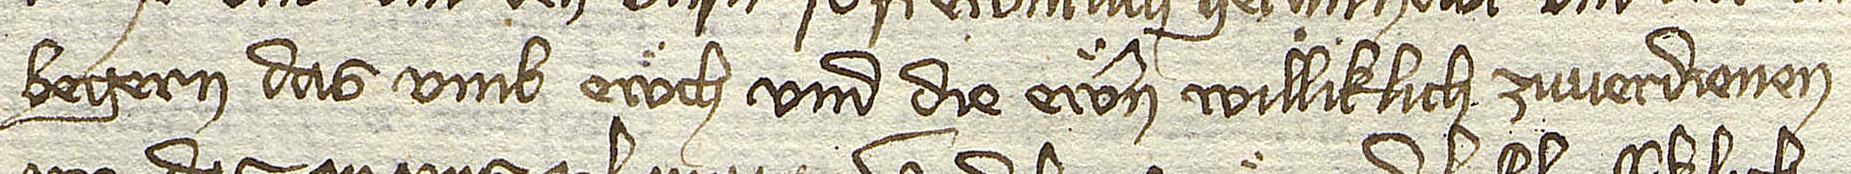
begern das vmb ewch vnd die ew*n williklich ʒuuerdienen
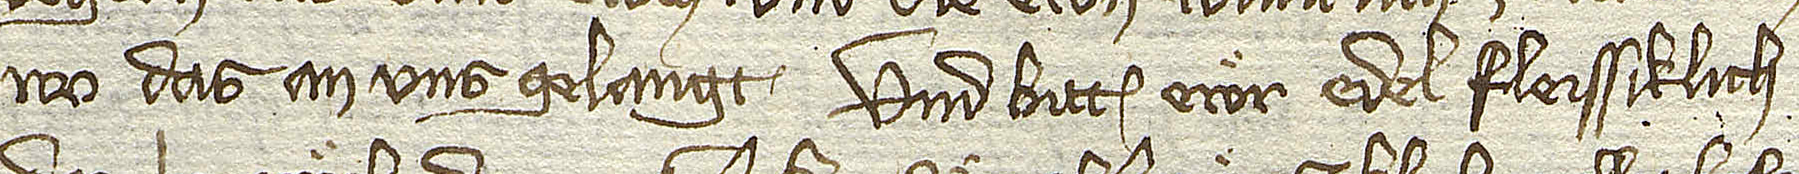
wo das an vns gelangt* Vnd bitt* ewr edel fleiſſiklich
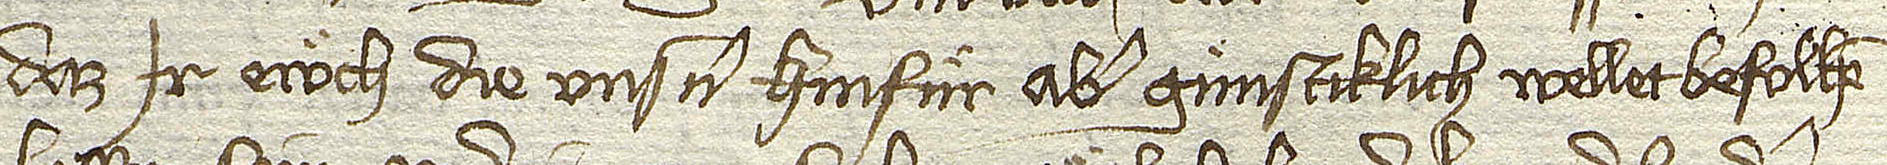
daʒ Ir ewch die vnſ*n hinfür ab* günſtiklich wellet befolhe*
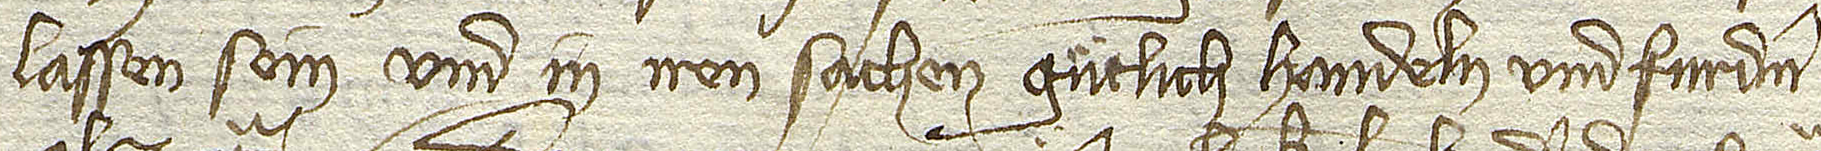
laſſen ſein vnd in iren ſachen gütlich handeln vnd furdn*
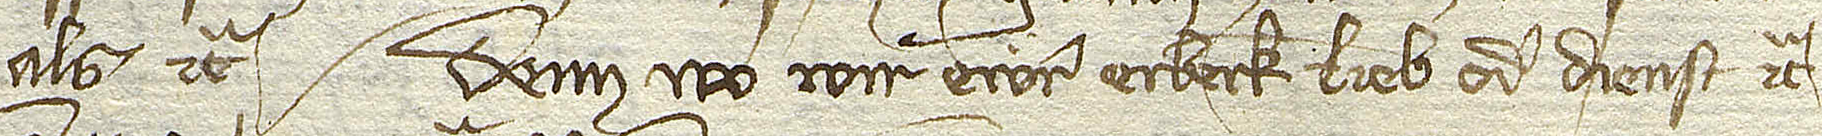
als ec* Denn wo wir ew*r erberk* lieb od* dienſt ec*
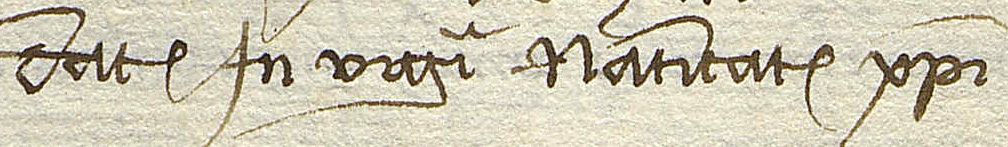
Dat* In vigi* Natitat* xpi*
